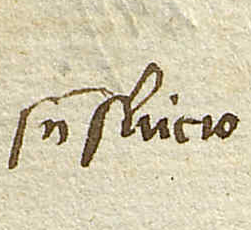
ſn* ſ*uicio
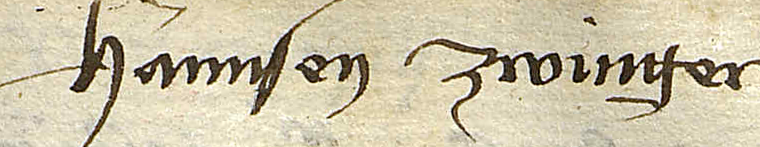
Hannſen Ʒwinger
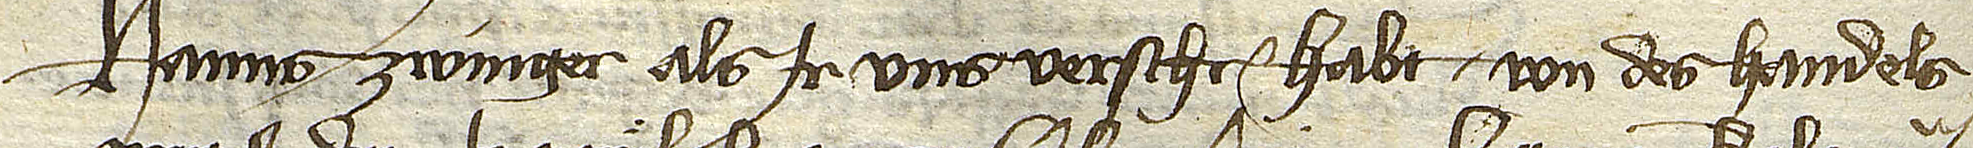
Hanns ʒwinger als Ir vns verſchr* habt / von des handels
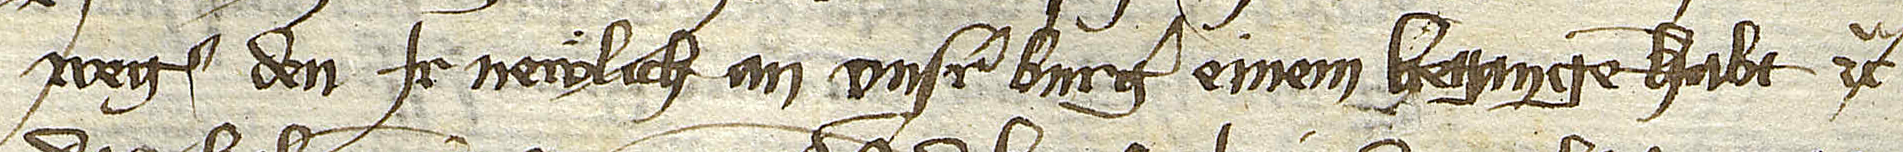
weg* den Ir neẅlich an vnſr* burg* einem begange* habt ec*
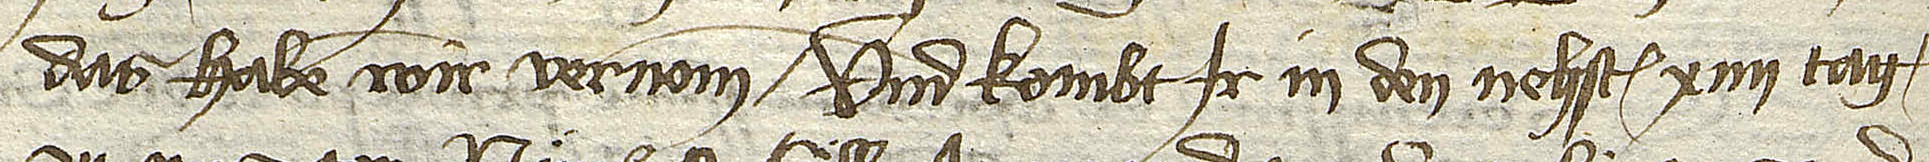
das habe* wir vernom* / Vnd kombt Ir in den nehſt* xiiii tag*
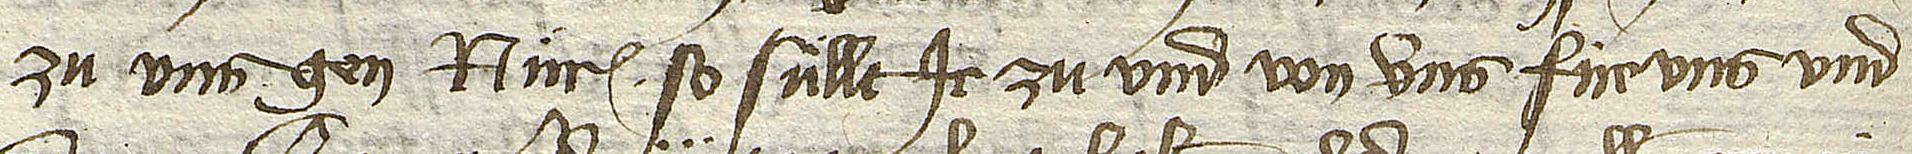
ʒu vns gen Nür* . ſo ſüllt Ir ʒu vnd von vns für vns vnd
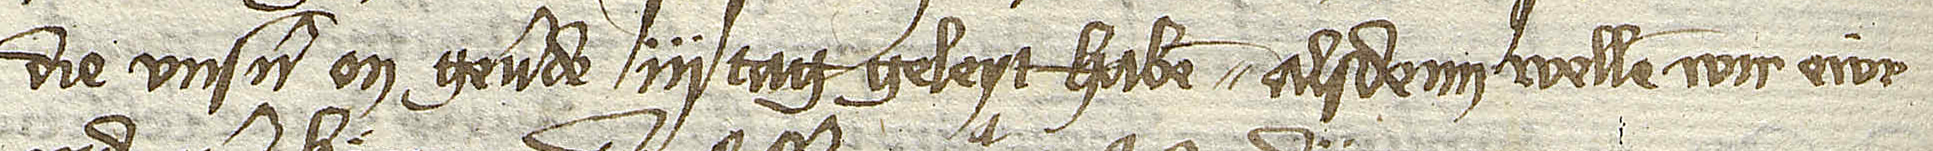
die vnſ*n on geu*de iii tag geleyt habe* / / alſdem welle* wir eẅr
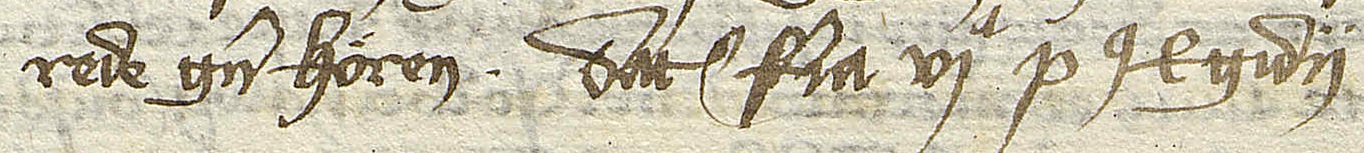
rede gn* hören. Dat* f*ia vi* p* Egidii
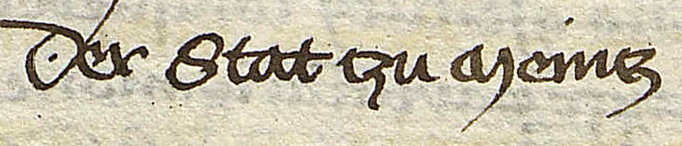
Der Stat cʒu Meincʒ
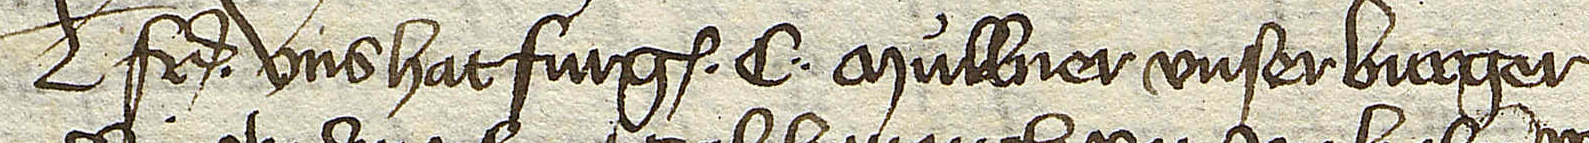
L* fr* . Vns hat fürg* .C. Müllner vnſer burger
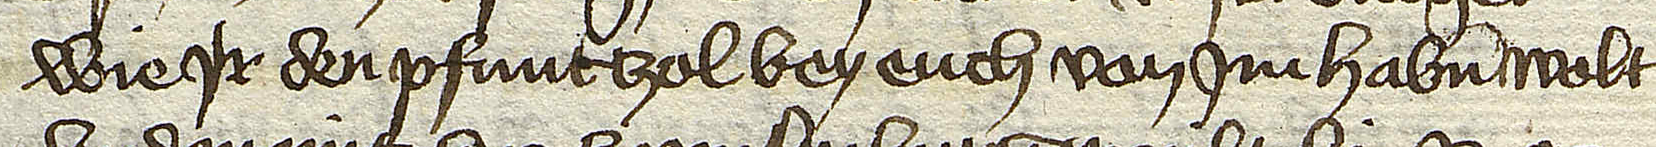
wie Ir den pfuntcʒol bey euch von Im habn* wolt
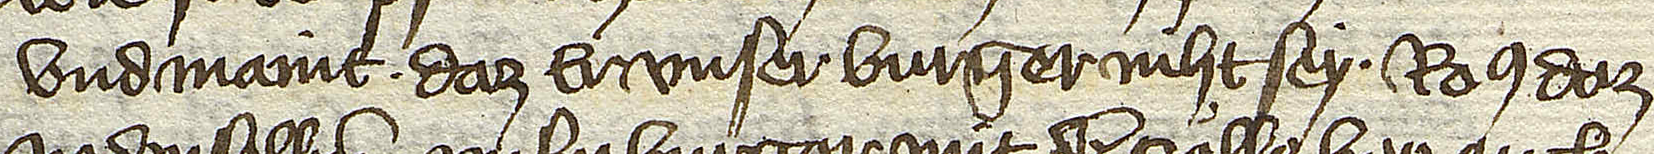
vnd maint . daʒ er vnſer burger niht ſey . Ro* daʒ
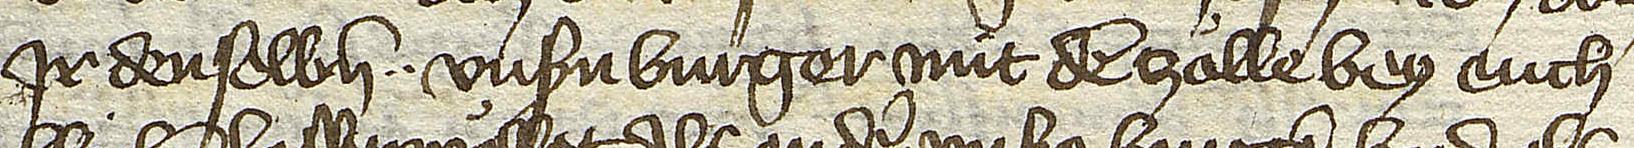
Ir denſelb*n . vnſ*n burger mit de* cʒölle bey euch
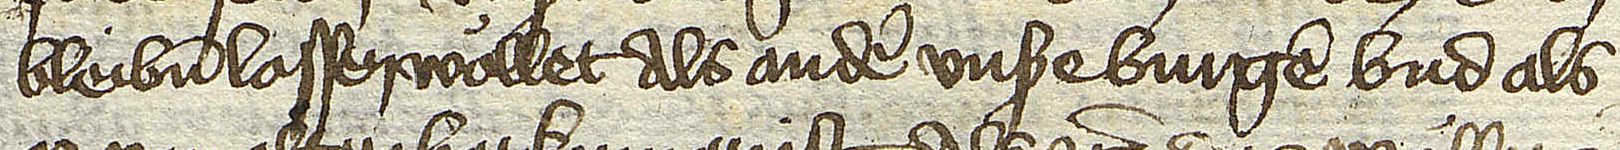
bleib*n laſſen wöllet Als and* vnſ*e burge* vnd als
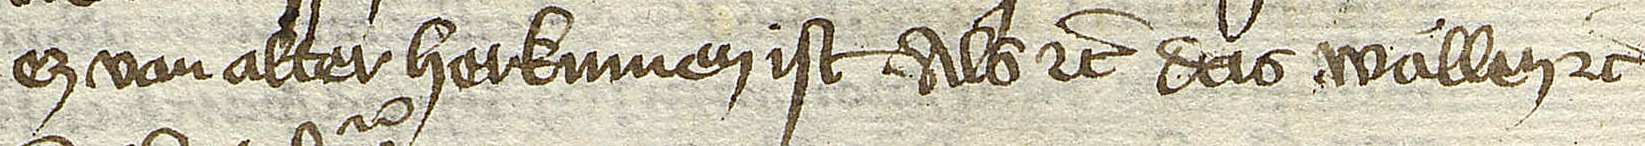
eʒ von alter herkumen iſt / Als ec* das wöllen ec*
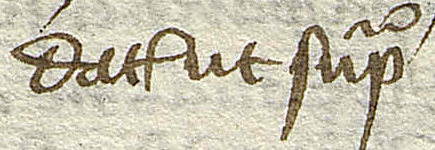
Dat* ut ſup*
